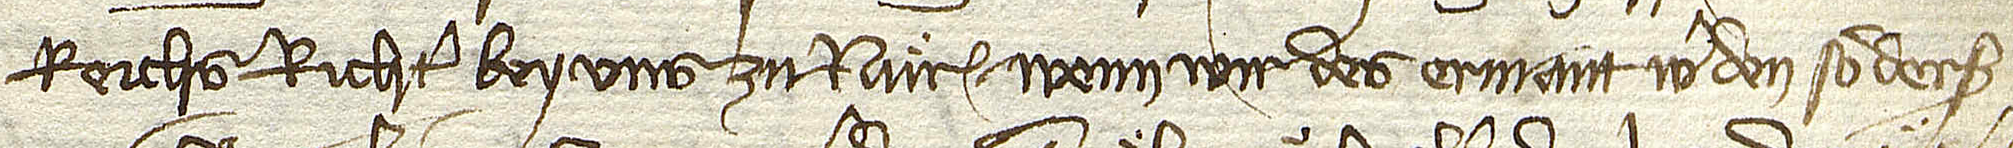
Reichs Richt* bey vns ʒu Nür* / wenn wir des ermant w*den ſo derſ*
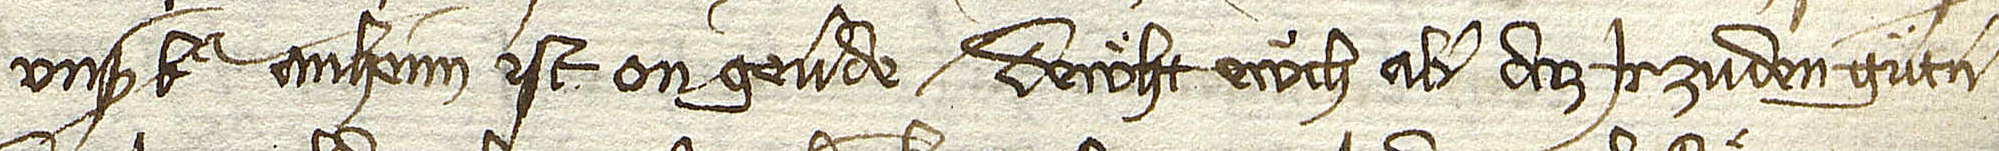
vnſ* b* anheim iſt on geu*de / Dewcht ewch ab* daʒ Ir ʒu den güt*n
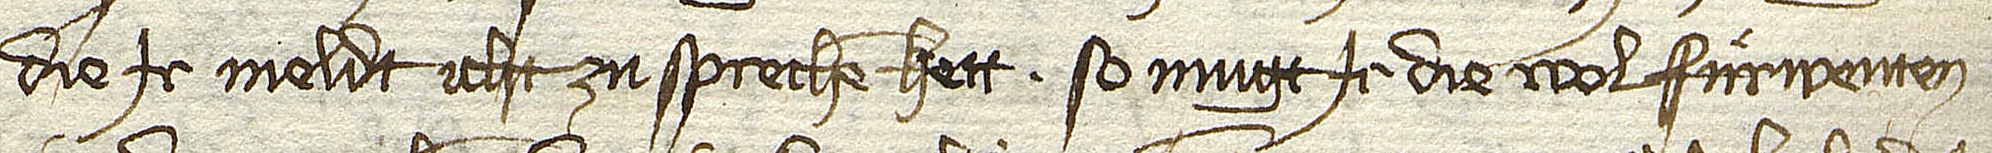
die Ir meldt ich ʒu ſpreche* hett . ſo mugt Ir die wol fürwenten
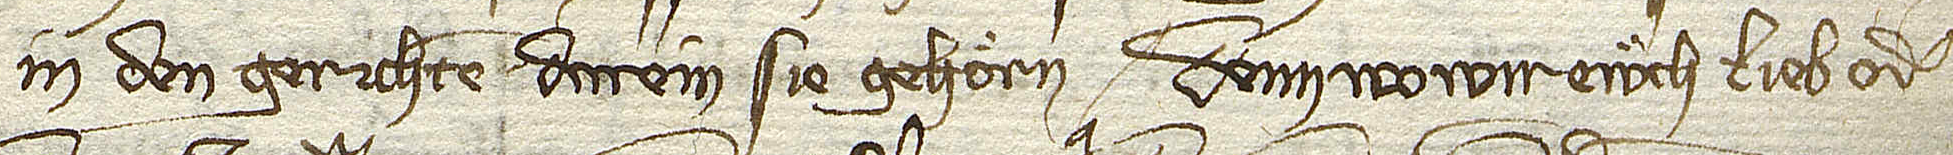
in den gerichte* darein ſie gehörn / Denn wo wir ewch lieb od*
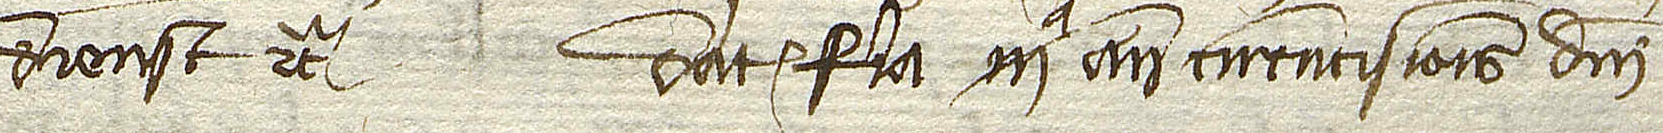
dienſt ec* Dat* fia* iii* an* circuciſiois* dni*
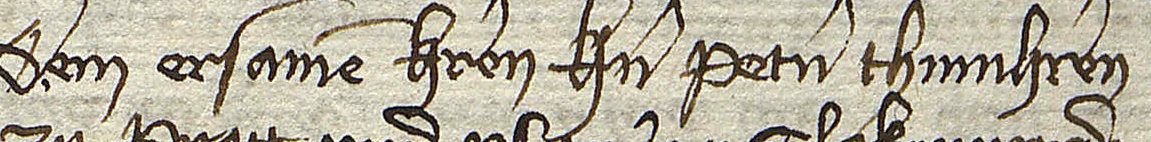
Dem erſame* h*ren H*n Pet*n thumh*ren
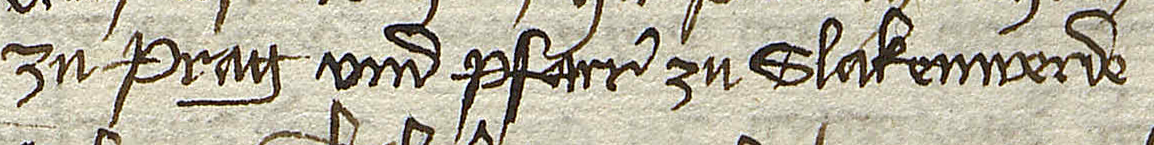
ʒu Prag vnd Pfarr* ʒu Slakenwerde
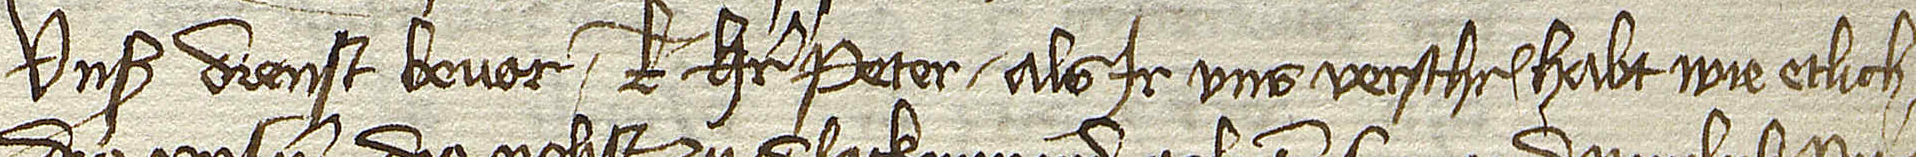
Vnſ* dienſt beuor / L* H*r Peter / als Ir vns verſchr* habt wie etlich
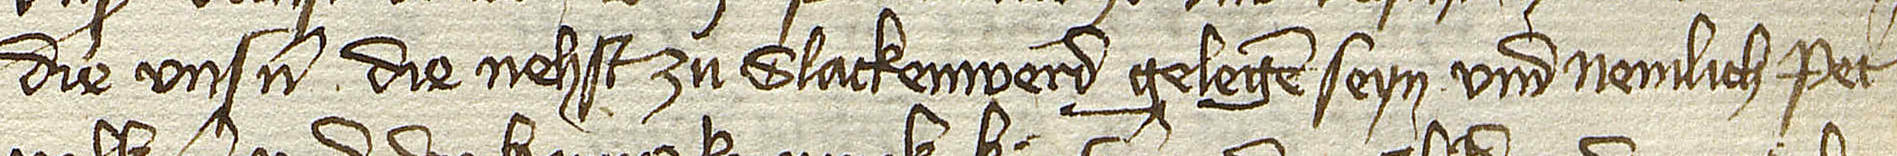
die vnſ*n die nehſt ʒu Slackenwerd gelege* ſeyn vnd nemlich Pet*
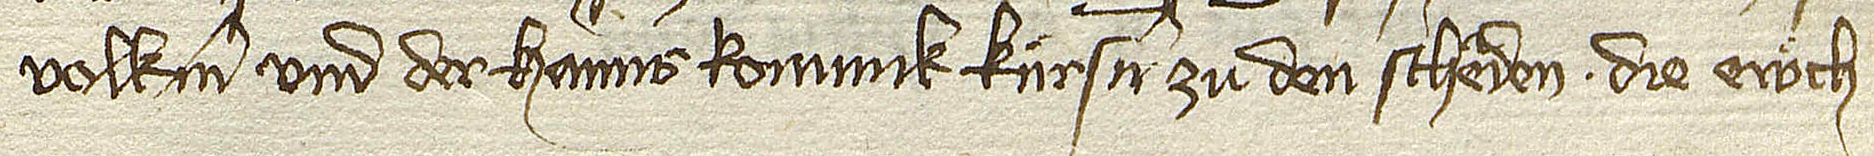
volkm* vnd der hanns Rommik kürſn* ʒu den ſcheden . die ewch
